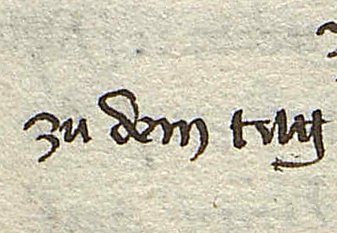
ʒu dem tag
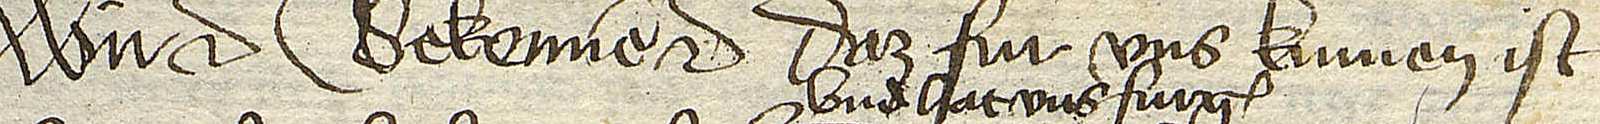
Wir ec* Bekenne* ec* daʒ für vns kumen iſt
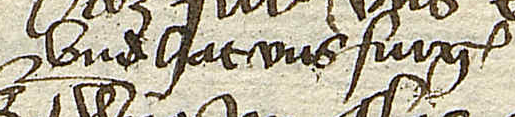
vnd hat vns furg*
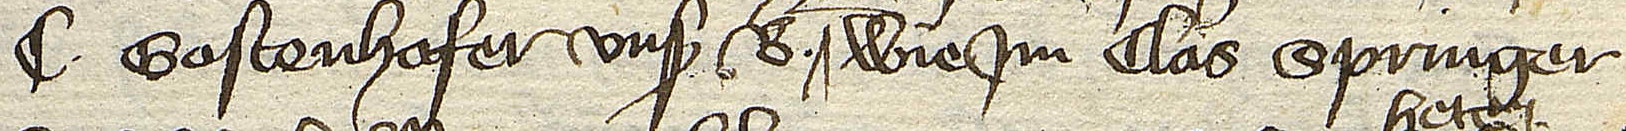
C . Goſtenhofer vnſ* B*. wie Im Clas Springer
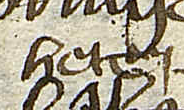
heten
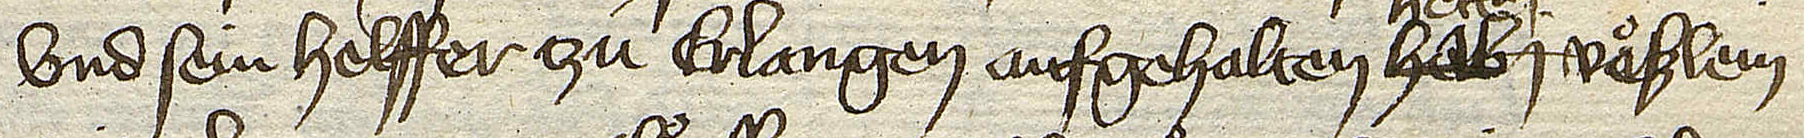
vnd ſein helffer cʒu Erlangen aufgehalten hab i vëſʒlein
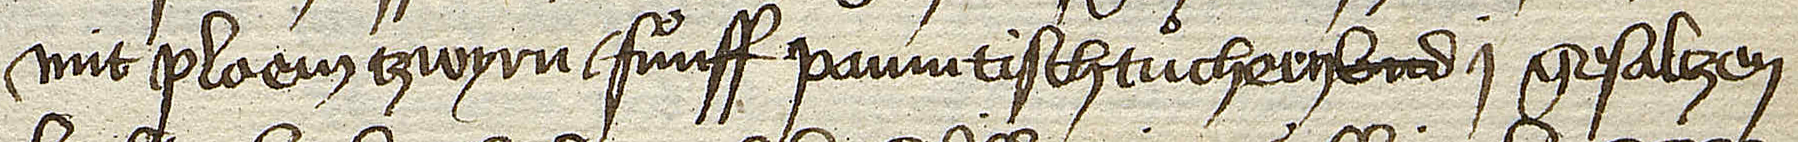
mit ploem cʒwyrn / fünff paumtiſchtüchern vnd i geſalcʒen
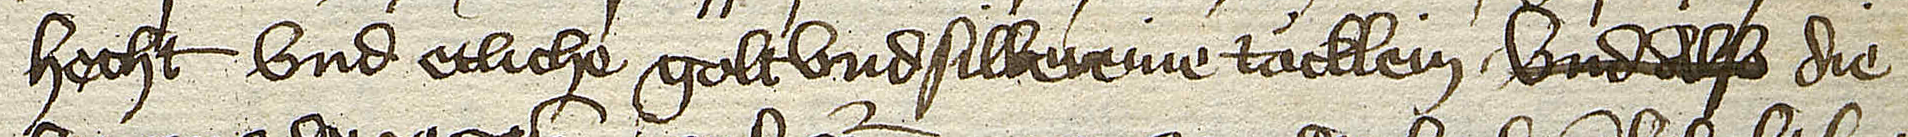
hecht vnd etliche golt vnd ſilbereine töcklein / vnd Alſo die
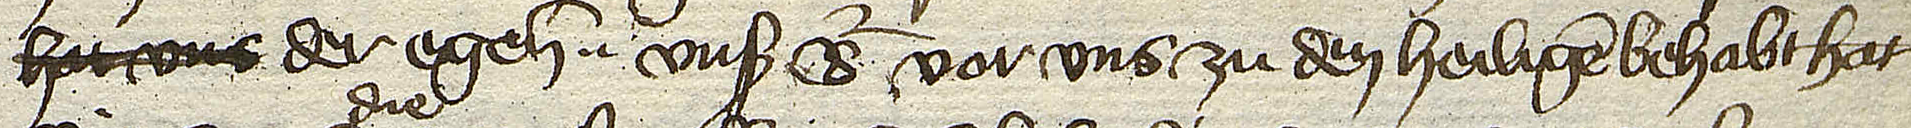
hat vns der egen* ~ vnſ* B* vor vns cʒu den heilige* behabt hat
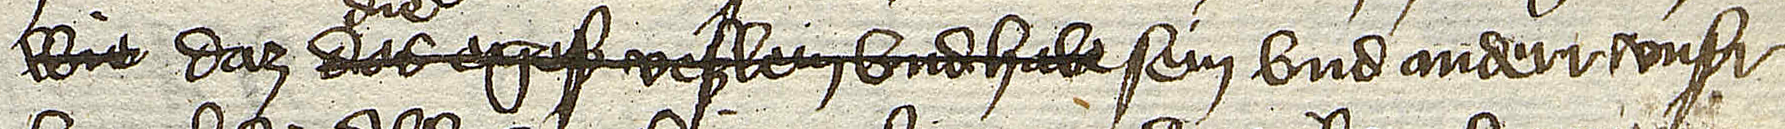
wie daʒ das egeſ* veſʒlein vnd habe ſein vnd anderr vnſ*r
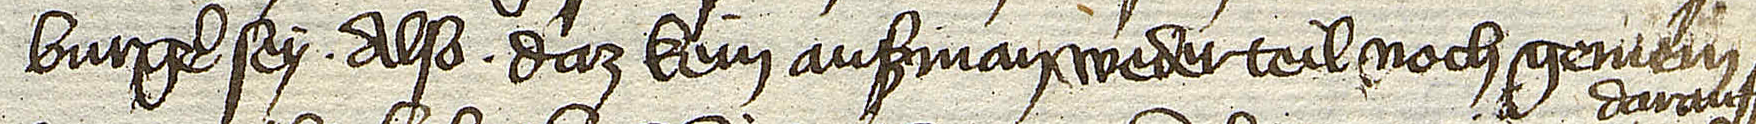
burge* ſey . Alſo . daʒ kein auſʒman weder teil noch gemein
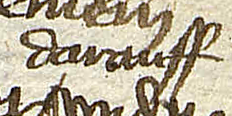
darauff
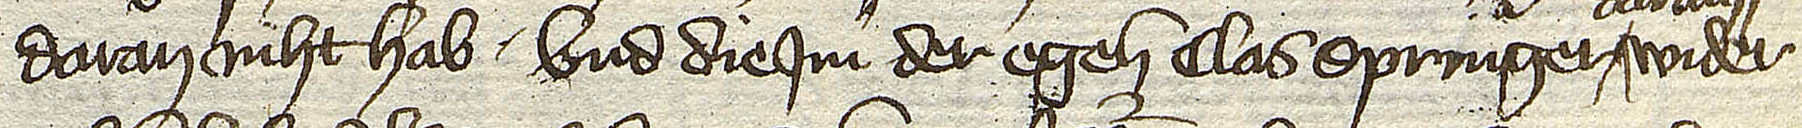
daran niht hab / vnd die Im der egen* Clas Springer wider
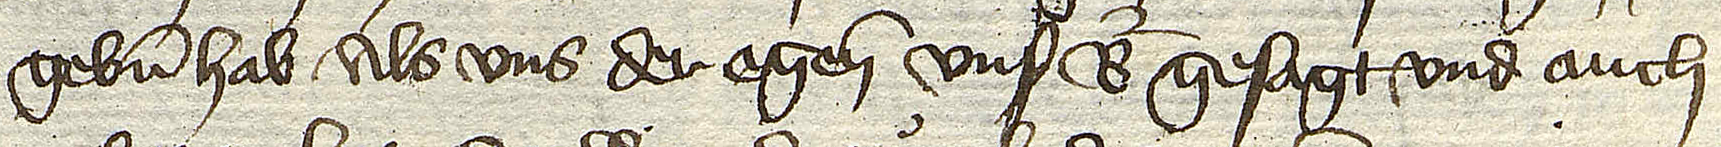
gebn* hab / Als vns der egen* vnſ* B* geſagt vnd auch
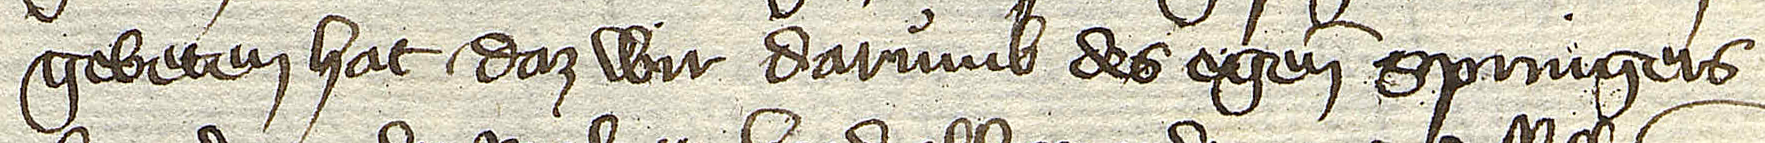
gebeten hat / daʒ wir darümb des egen* Springers
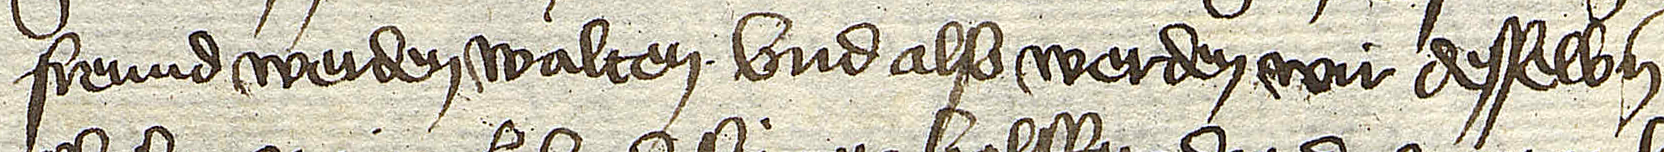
freund werden wölten . vnd alſo werden wir deſſelbn*
